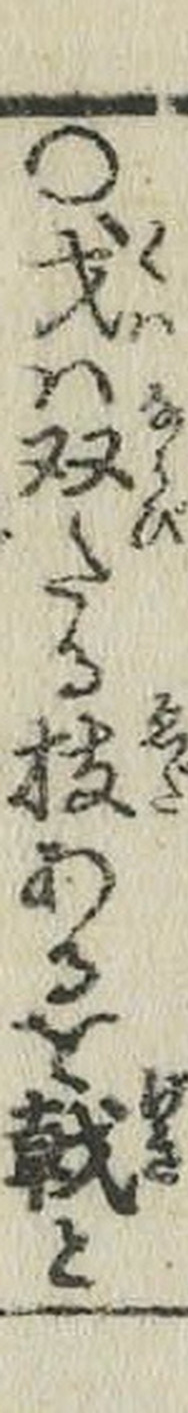○戈は双たる枝あるを戟と
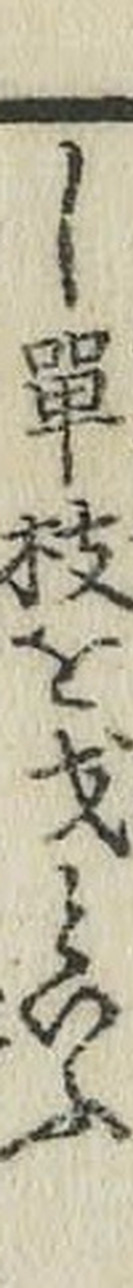し単枝を戈といふ
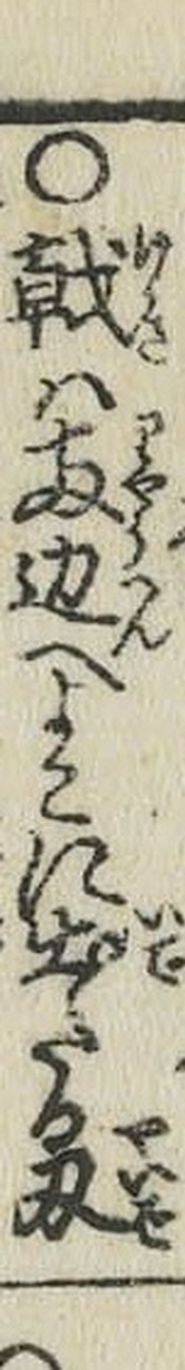○戟は両辺へよこに出たる刃
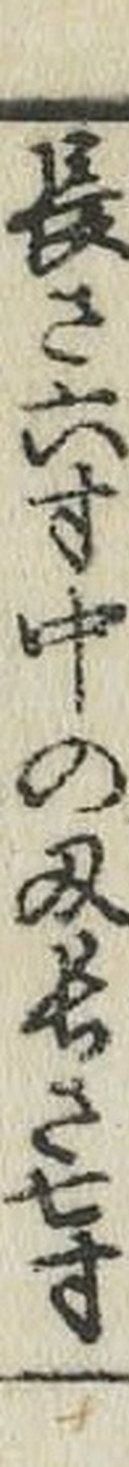長さ六寸中の刃長さ七寸
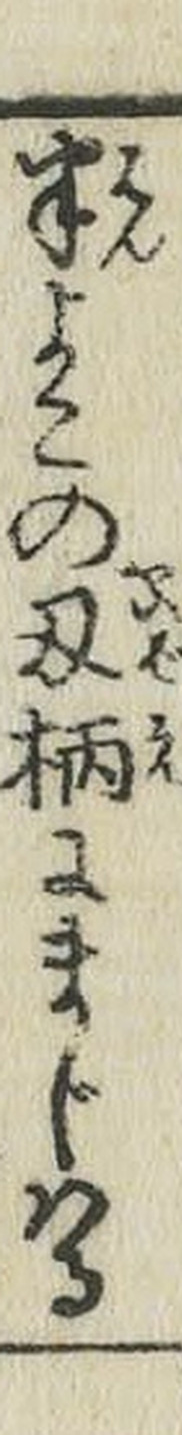半よこの刃柄にまじはる
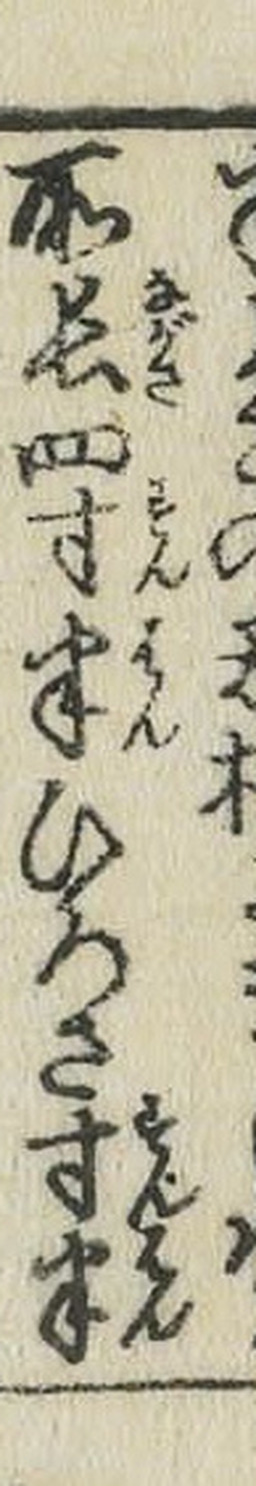所長四寸半ひろさ寸半
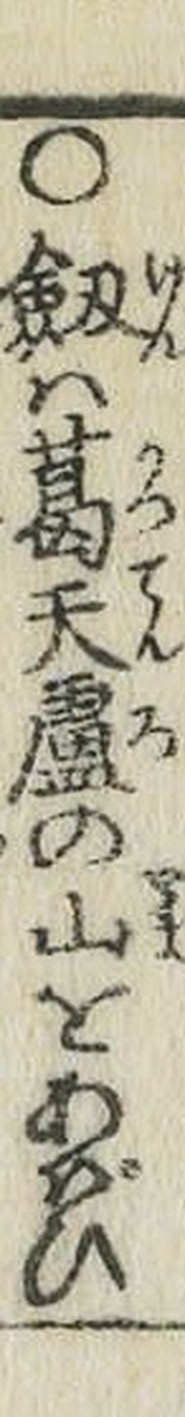○剣は葛天盧の山をあばひ
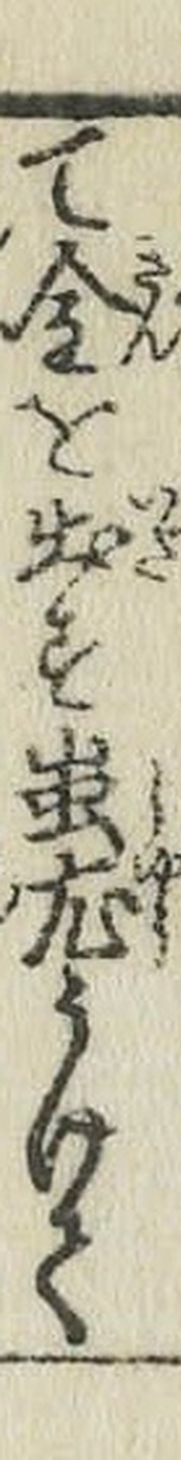て金を出す蚩尤うけて
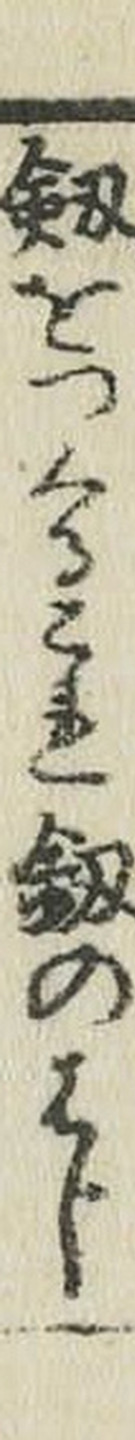剣をつくるこれ剣のはじ
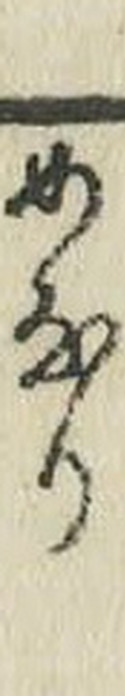めなり
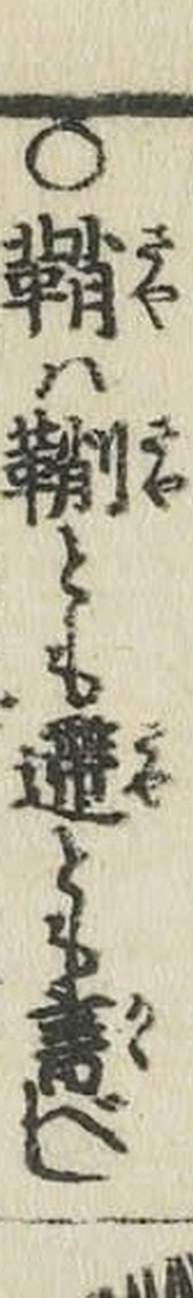○鞘は鞩とも遰とも書べし
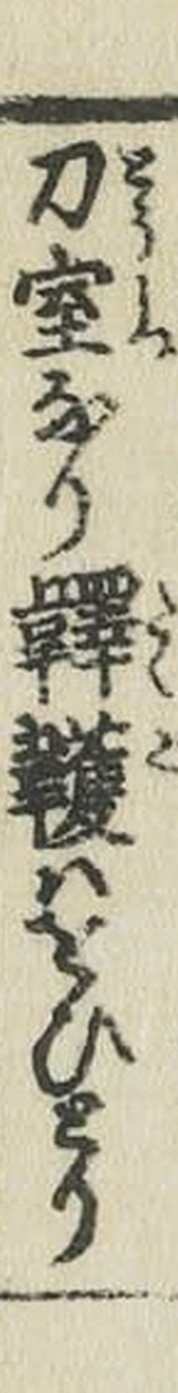刀室なり𩍜䪝はをひとり
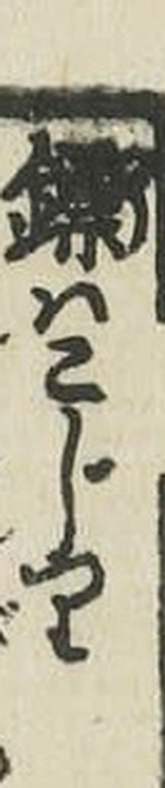鏢はこじり
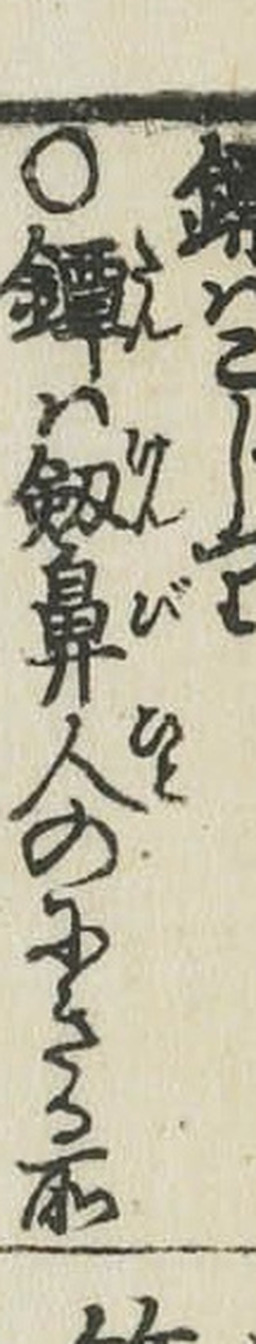○鐔は剣鼻人のにきる所
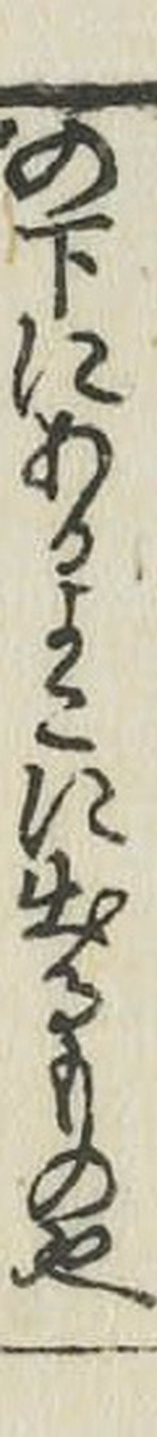の下にあるよこに出るもの也
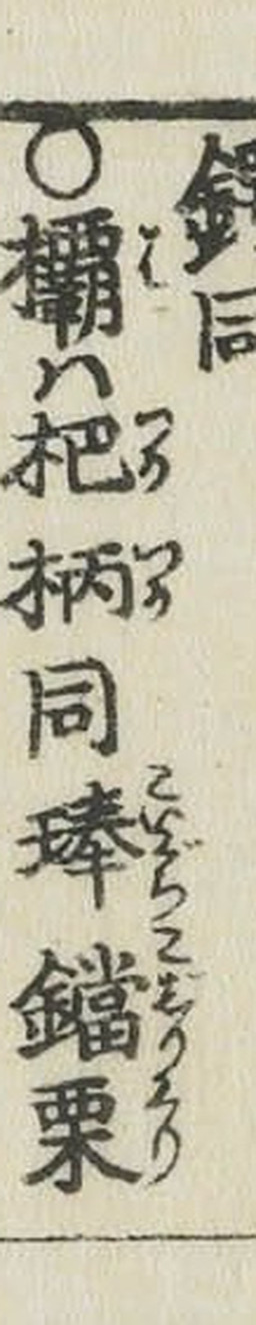○欛は杷柄同琫鐺栗
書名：増補頭書訓蒙図彙大成 10巻 5:巻之9-11
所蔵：東京学芸大学教育コンテンツアーカイブ
